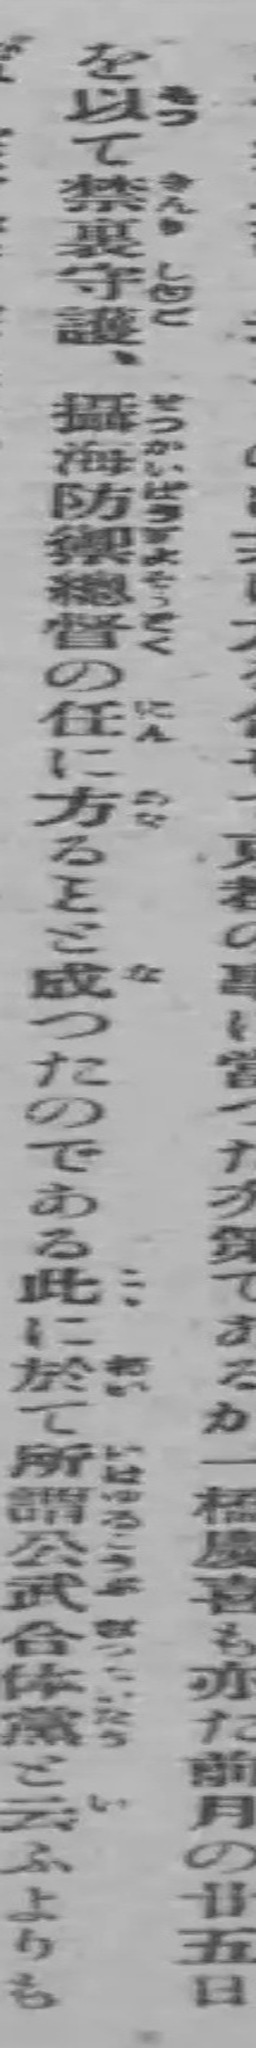を以て禁裏守護、摂海防禦総督の任に方ることと成つたのである此に於て所謂公武合体党と云ふよりも
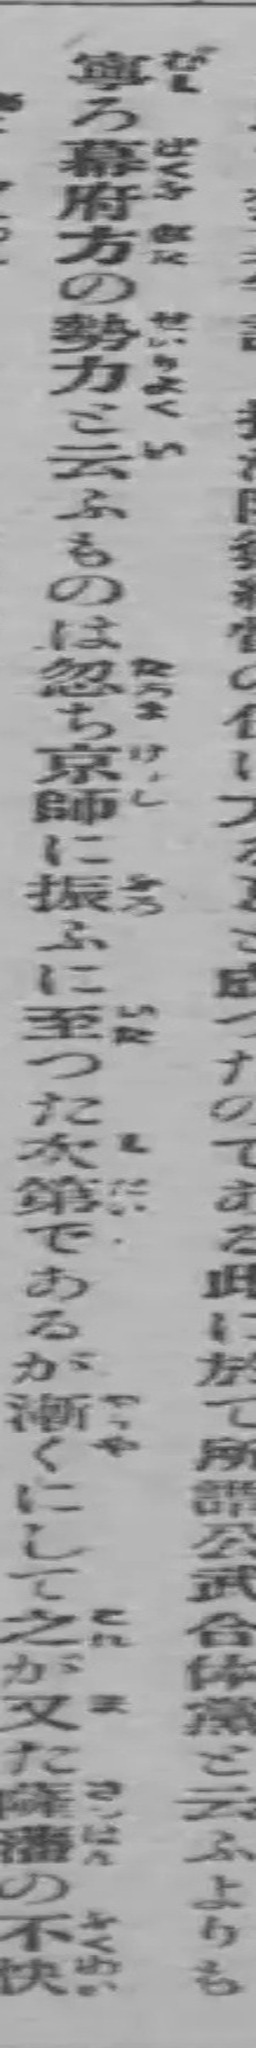薩藩の意向寧ろ幕府方の勢力と云ふものは忽ち京師に振ふに至つた次第であるが漸くにして之が又た薩藩の不快
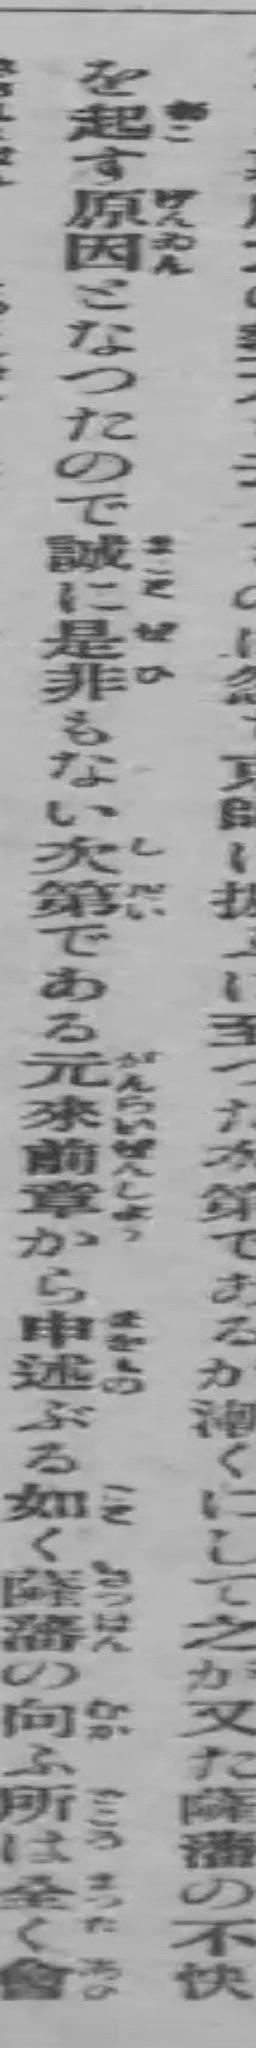を起す原因となつたので誠に是非もない次第である元来前章から申述ぶる如く薩藩の向ふ所は全く会
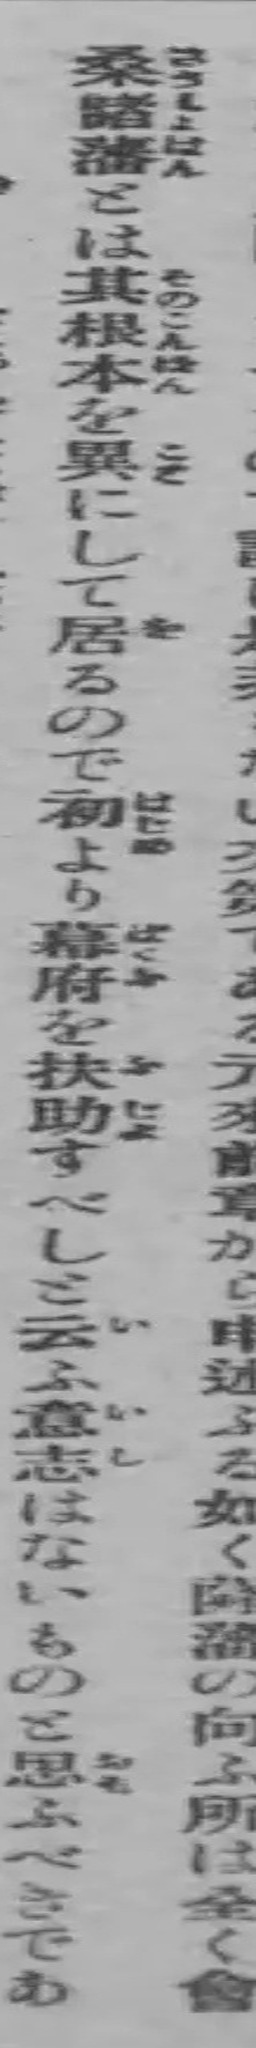桑緒藩とは其根本を異にして居るので初より幕府を扶助すべしと云ふ意志はないものと思ふべきであ
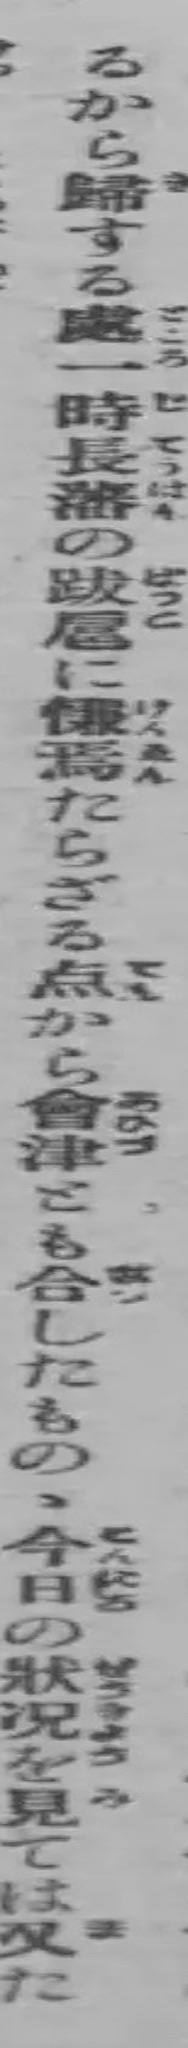るから帰する処一時長藩の跋扈に慊焉たらざる点から会津とも合したものゝ今日の状況を見ては又た
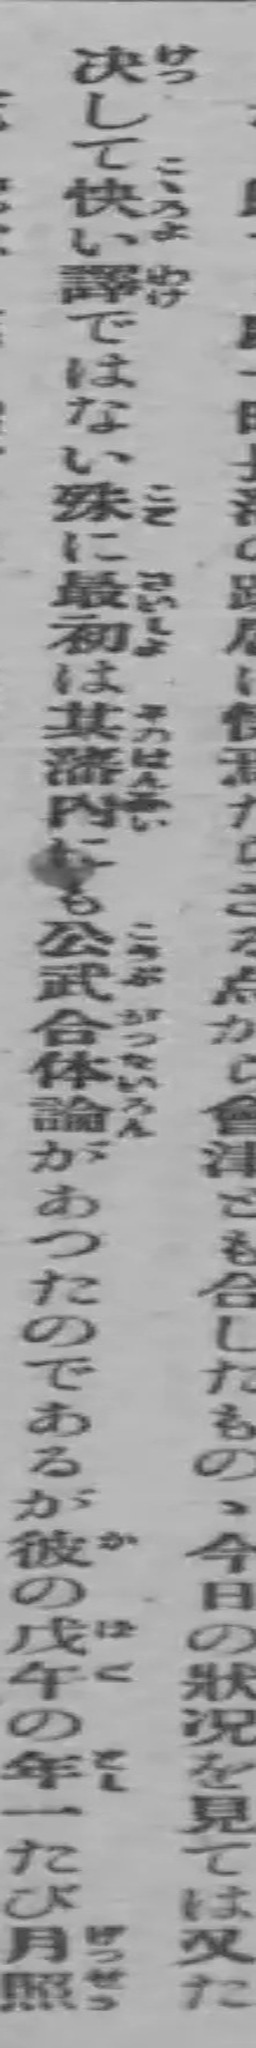決して快い訳ではない殊に最初は其藩内にも公武合体論があつたのであるが彼の戊午の年一たび月照
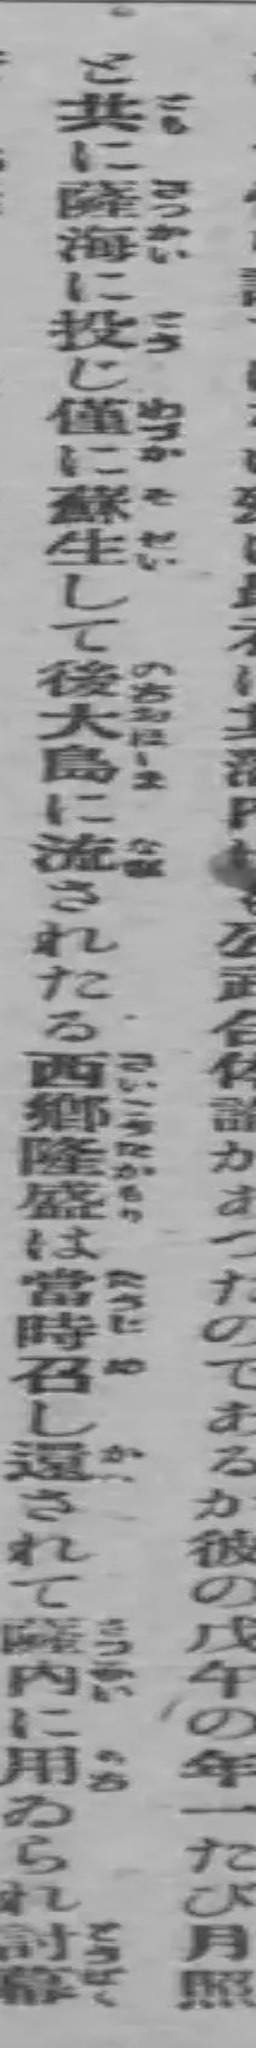と共に薩海に投じ僅に蘇生して後大島に流されたる西郷隆盛は当時召し還されて薩内に用ゐられ討幕
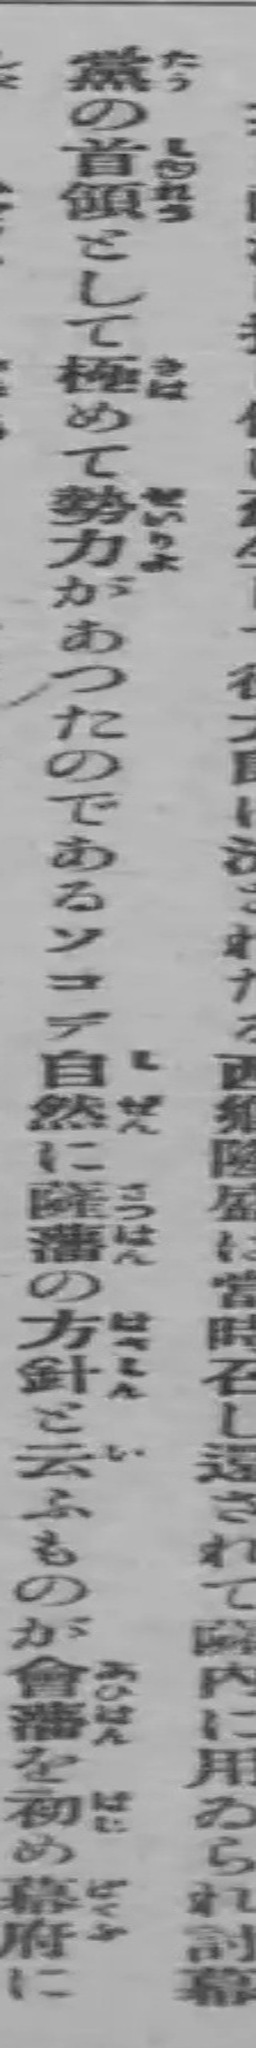党の首領として極めて勢力があつたのであるソコデ自然に薩藩の方針と云ふものが会藩を初め幕府に
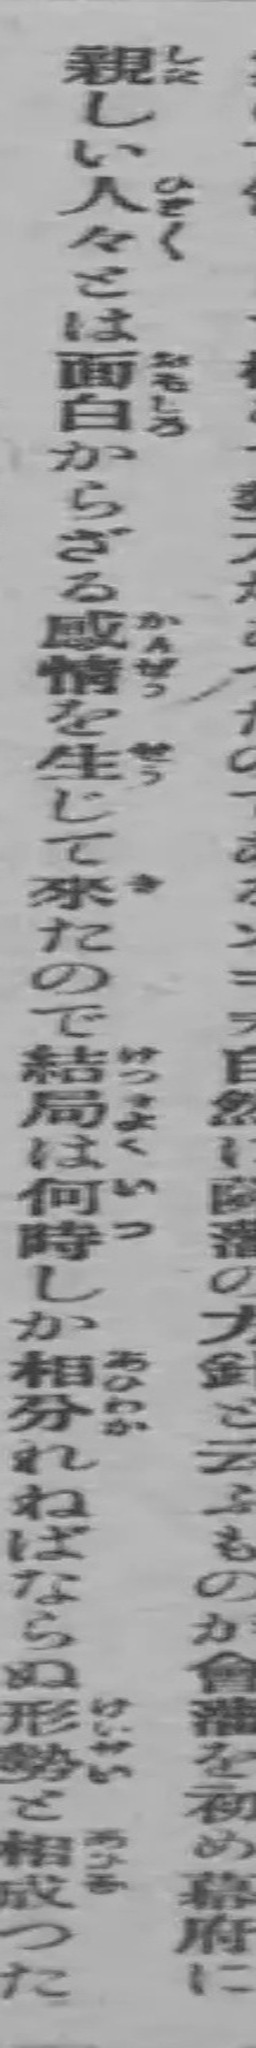親しい人々とは面白からざる感情を生じて来たので結局は何時しか相分れねばならぬ形勢と相成つた
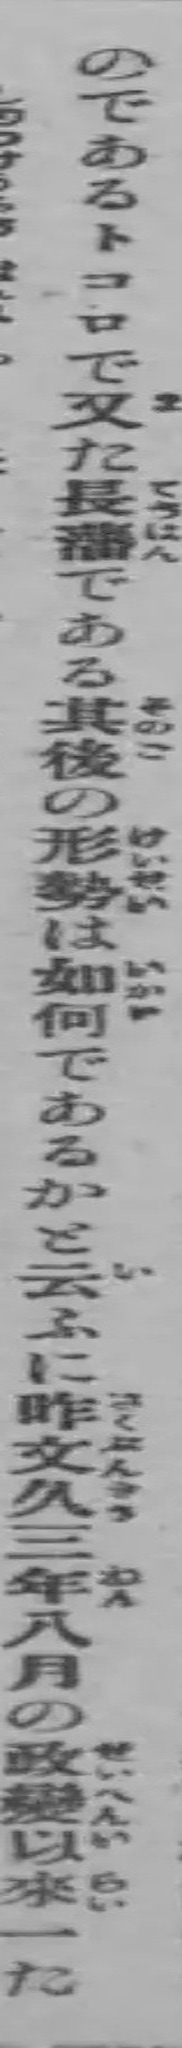のであるトコロで又た長藩である其後の形勢は如何であるかと云ふに昨文久三年八月の政変以来一た
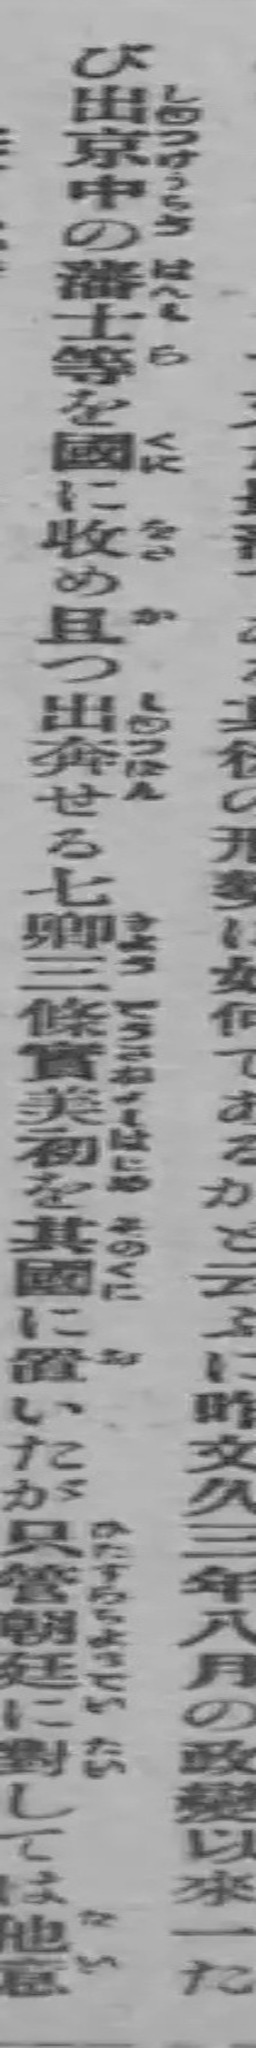び出京中の藩士等を国に収め且つ出奔せる七卿三條実美初を其国に置いたが只管朝廷に対しては他意
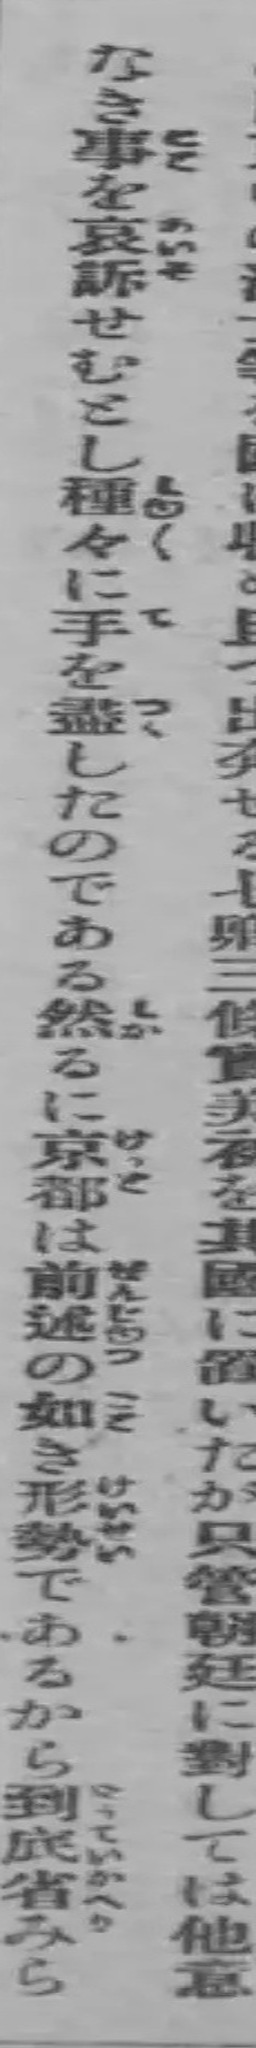なき事を哀訴せむとし種々に手を尽したのである然るに京都は前述の如き形勢であるから到底省みら
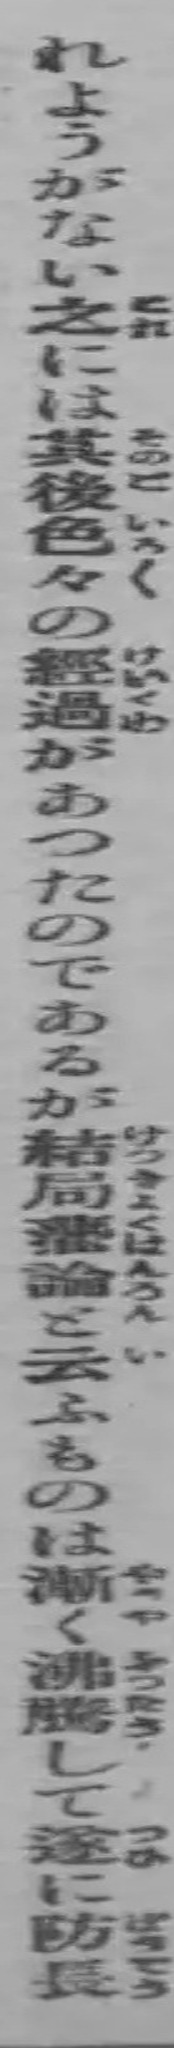れようがない之には其後色々の経過があつたのであるが結局藩論と云ふものは漸く沸騰して遂に防長
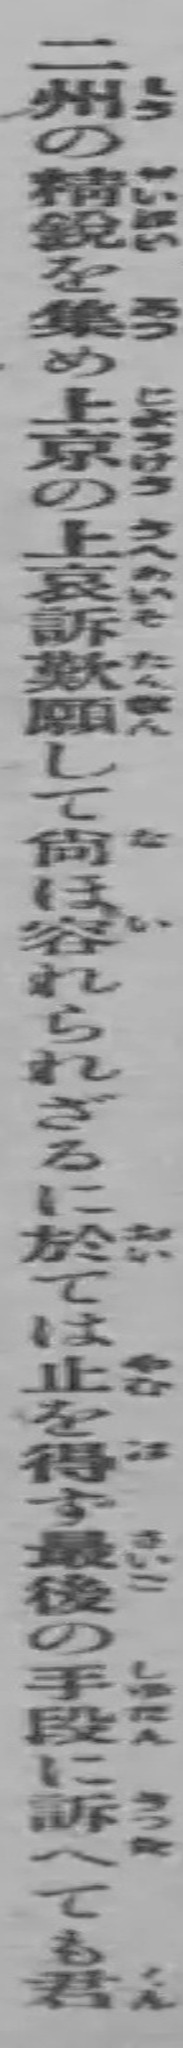二州の精鋭を集め上京の上哀訴歎願して尚ほ容れられざるに於ては止を得ず最後の手段に訴へても君
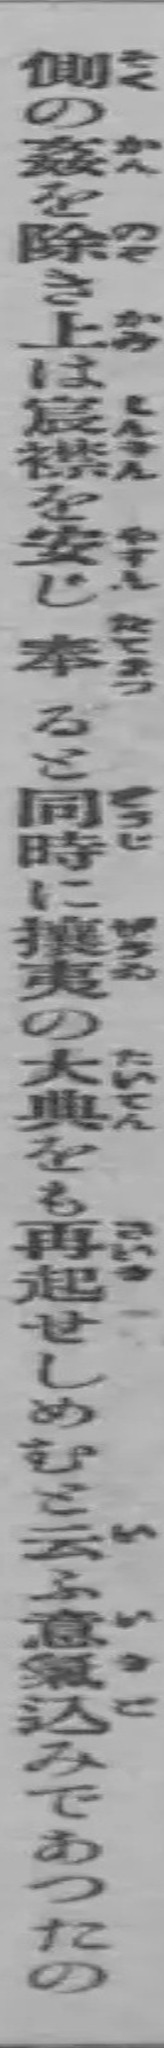側の姦を除き上は宸襟を安じ奉ると同時に攘夷の大典をも再起せしめむと云ふ意気込みであつたの
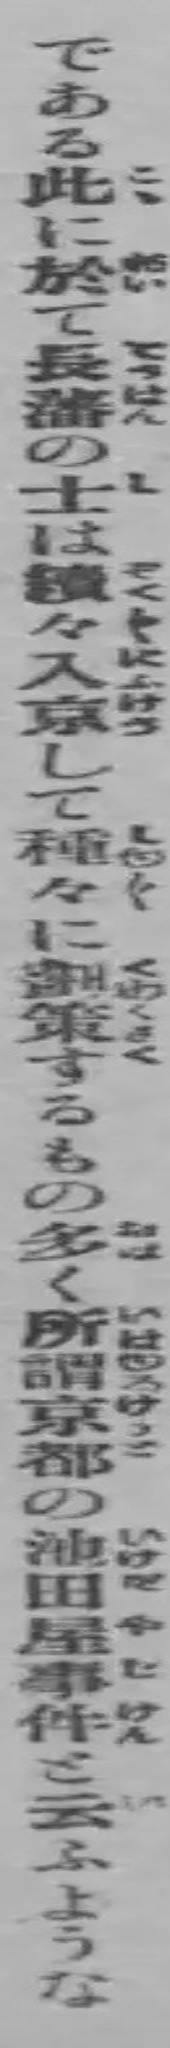である此に於て長藩の士は続々入京して種々に画策するもの多く所謂京都の池田屋事件と云ふような
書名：豊橋市史談
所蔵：国立国会図書館 National Diet Library, JAPAN
